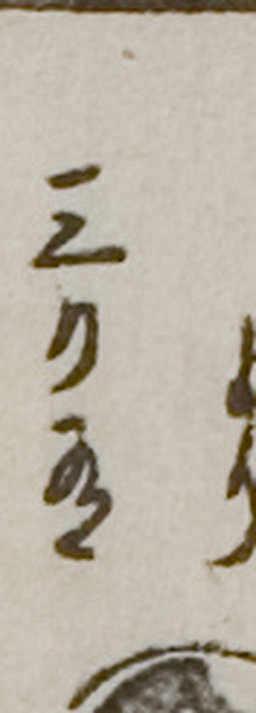三り半
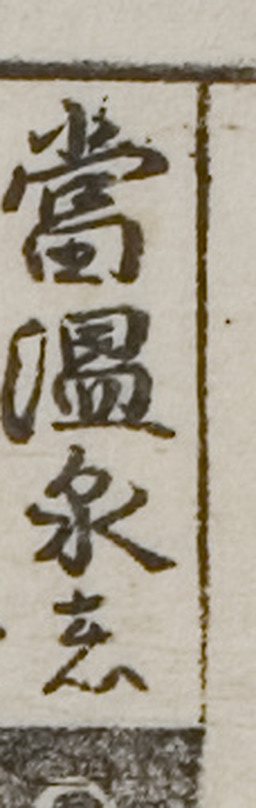当温泉は
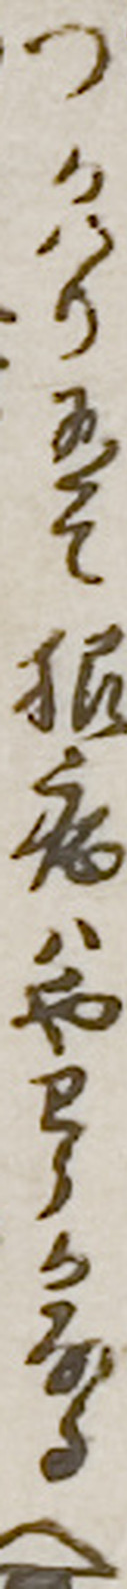かはり有て服病はやわらかなる
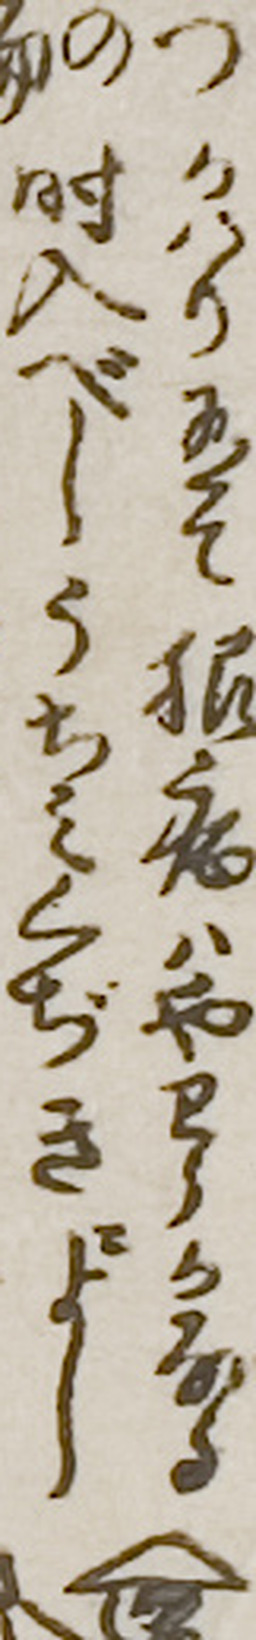時入べしうちみくぢきによし
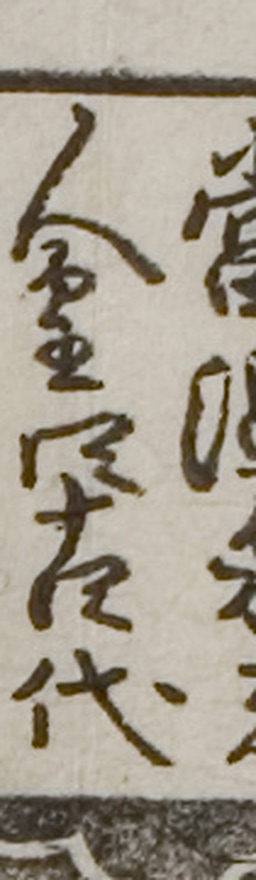人皇四十四代
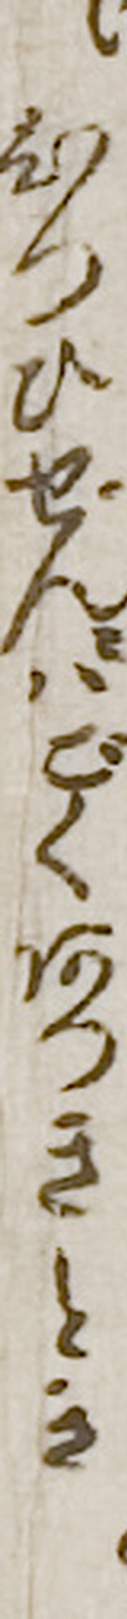ひつひぜんにはごくあつきとき
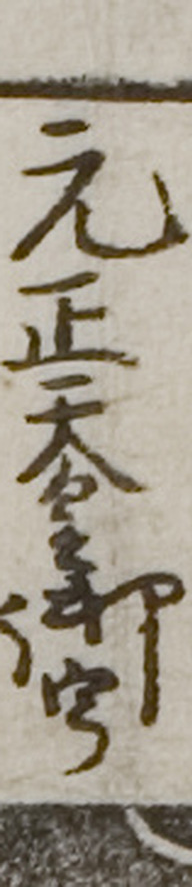元正天皇御宇
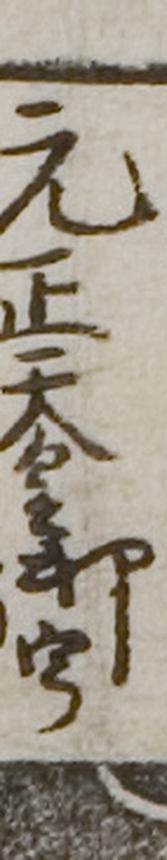元正天皇御宇
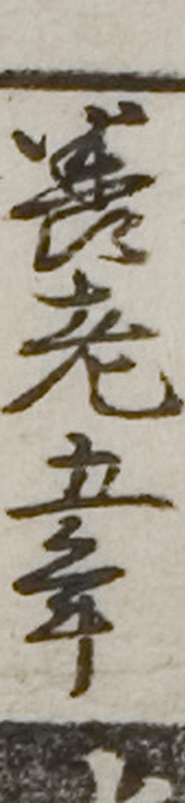養老五年
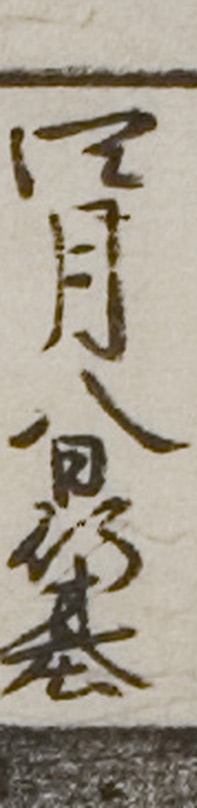四月八日行基
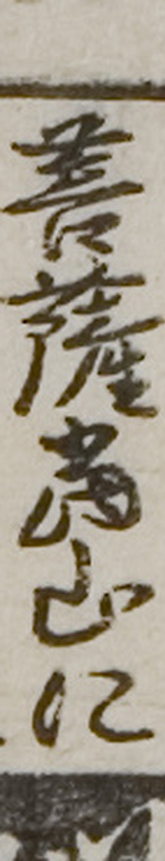菩薩当山に
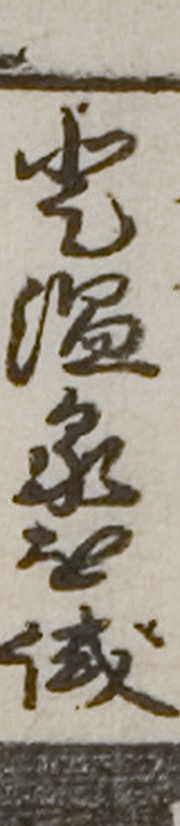登温泉を成
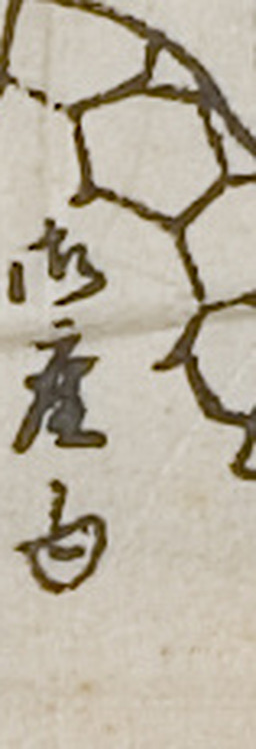御座ゆ
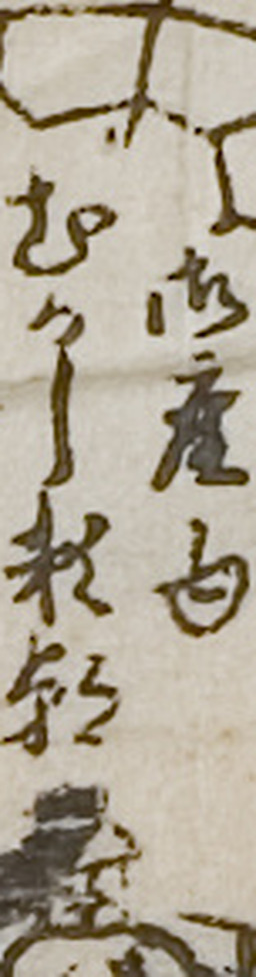むかし頼朝
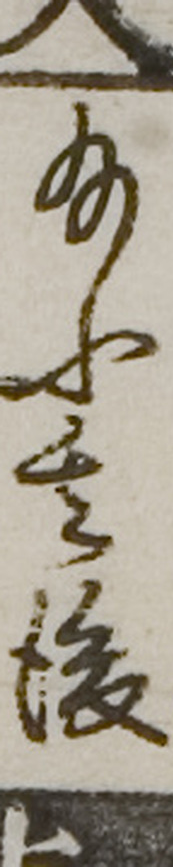給ふ其後
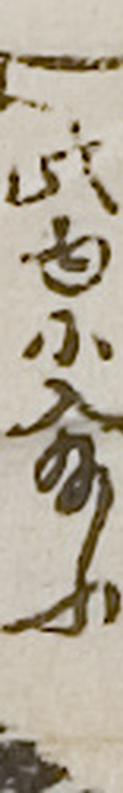此ゆに入給ふ
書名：上州草津温泉大図
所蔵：東京大学総合図書館 General Library in the University of Tokyo, JAPAN
